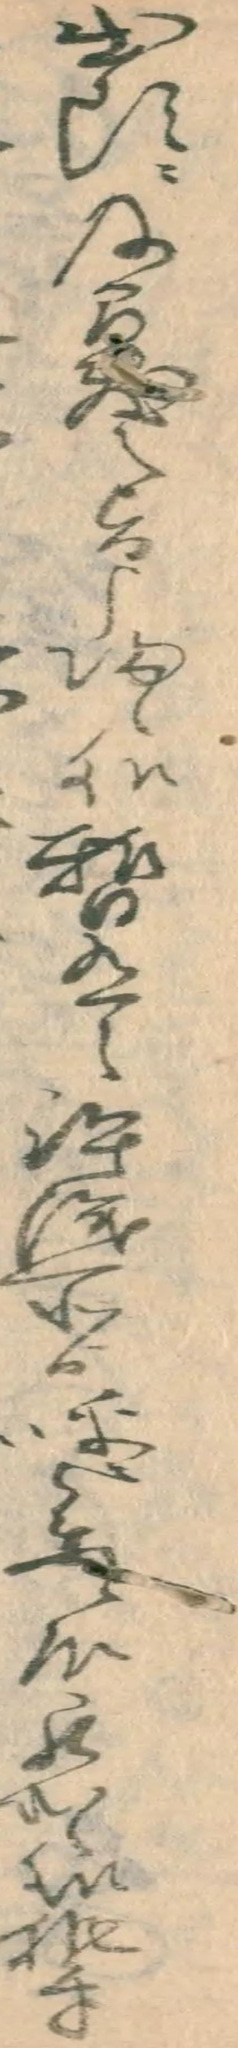出頭ニ及間敷之旨申渡候処暫有之評議所ゟ呼ニ被参候故罷出候処執筆
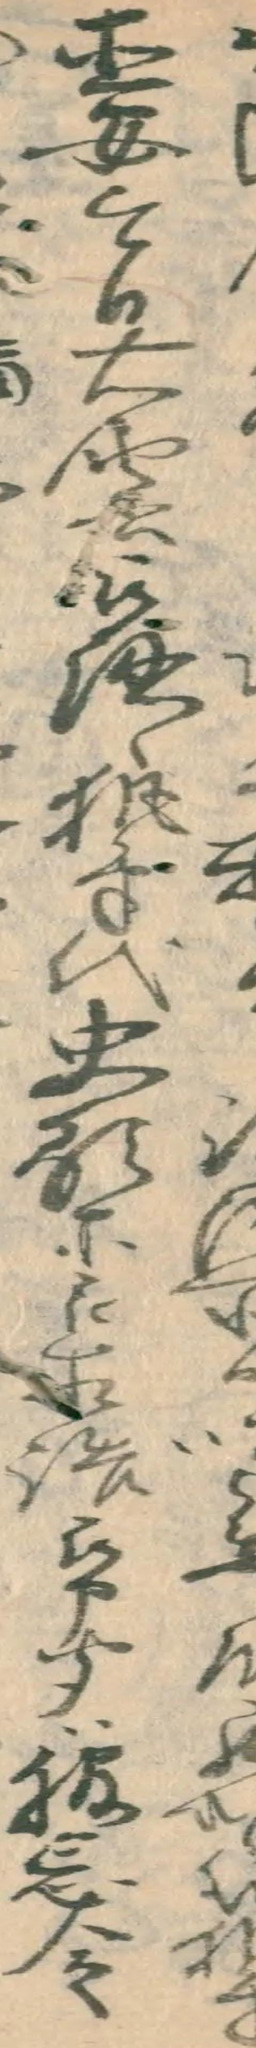直安今日右届書被認候執筆代史顕等被相詰被申聞ハ服忌令
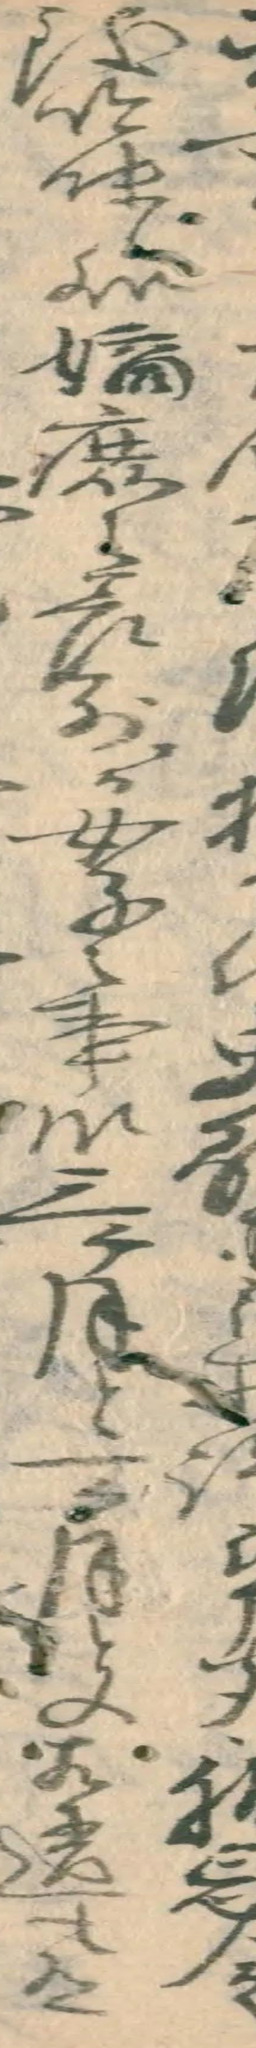致吟味候処嫡庶之差別ニ而女子之事故三ヶ月と一ケ月との相違も有
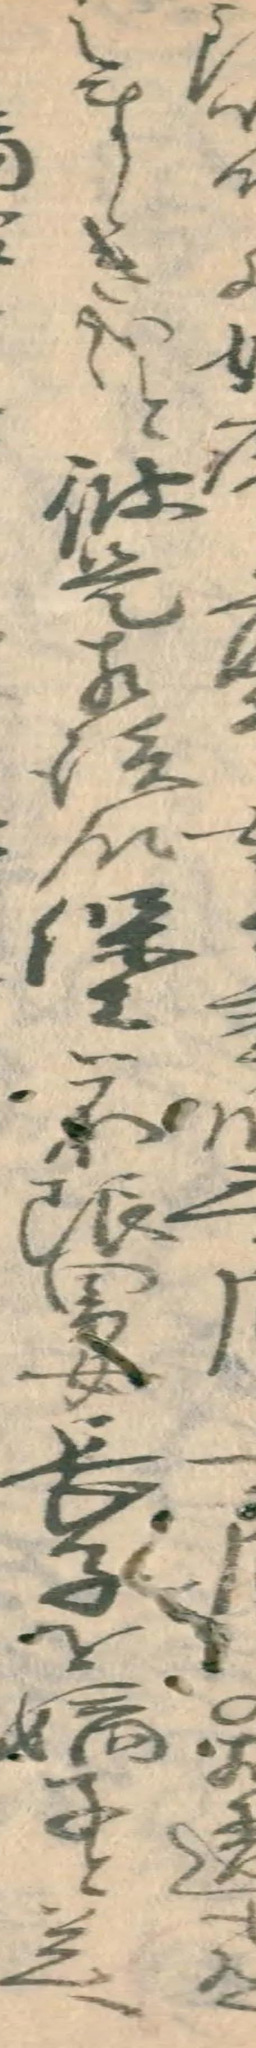之ましき哉と彼是相談故保土ハ不限男女長子を嫡子と覚へ
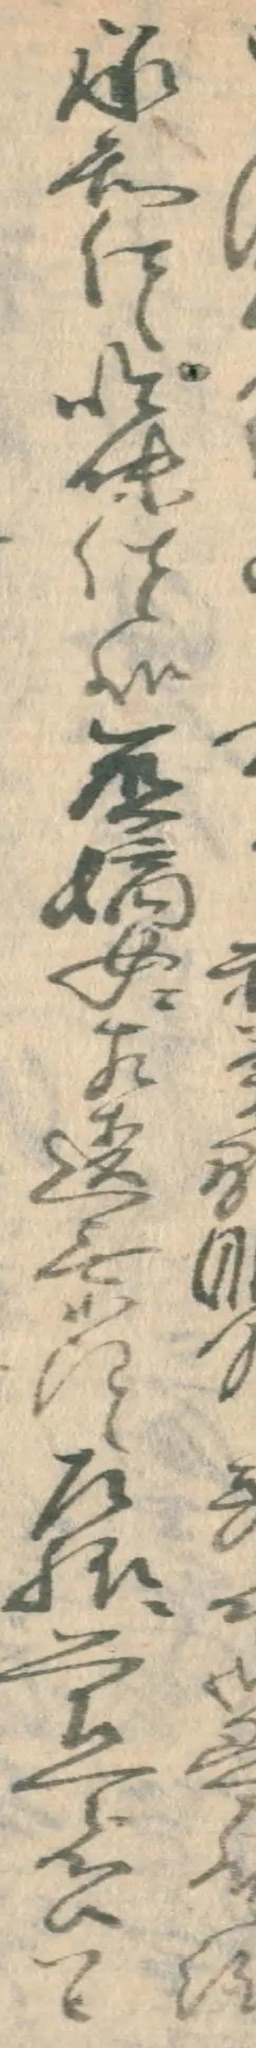承知仕候吟味仕候処愈嫡女ニ相違無御座候左様ニ思召可被下候以上
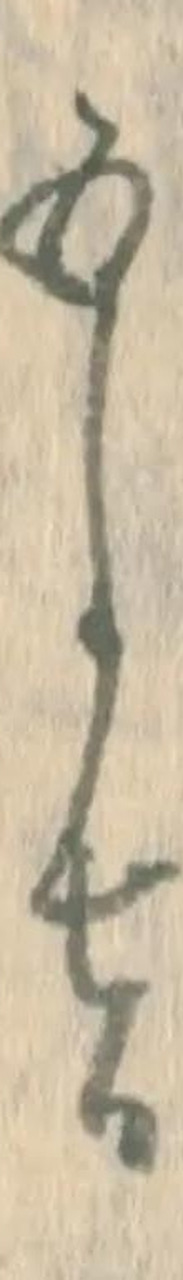五月七日
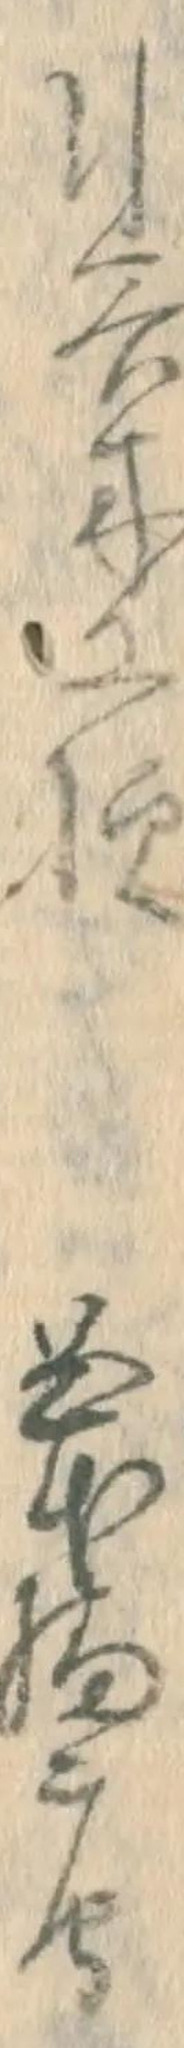水谷木工様岡本播磨守
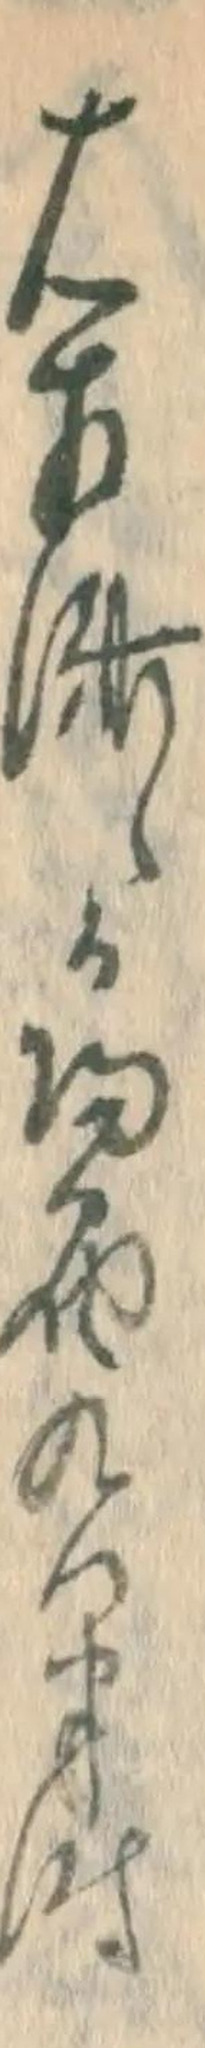右相済候而帰宿九ツ半時
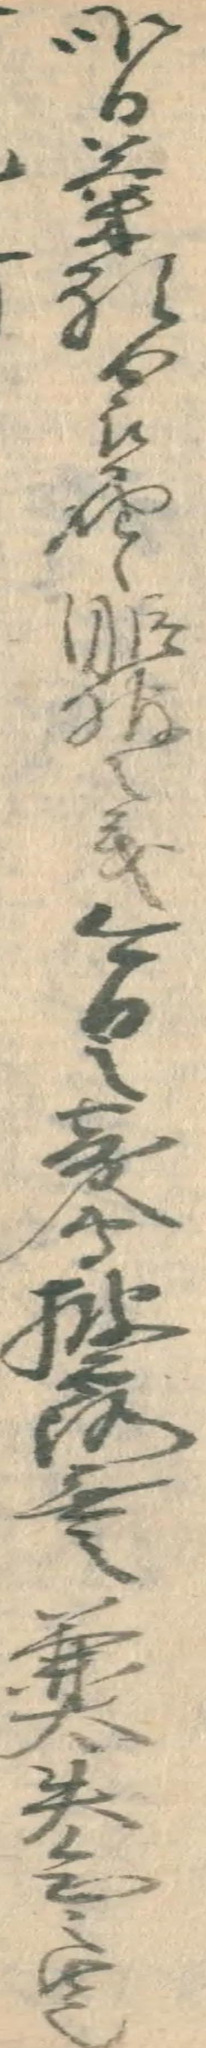昨日菊顕ゟ被届候暇服之義今日之寄会披露無之兼太失念之由也
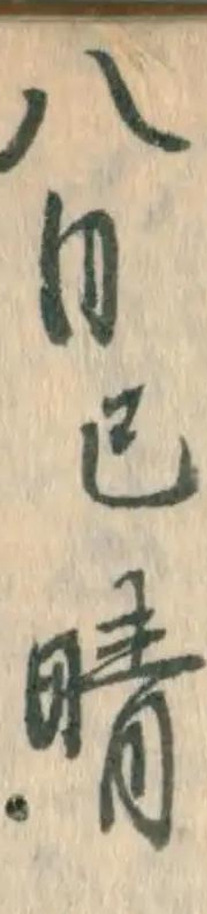八日巳晴
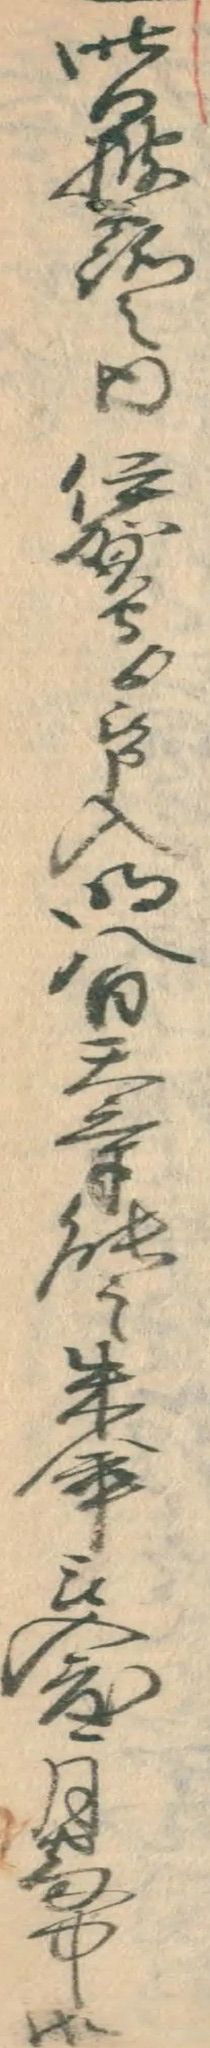一昨日披露之内伊賀守ゟ被申入明八日天気能候ハヽ朱傘被入度候月番中御

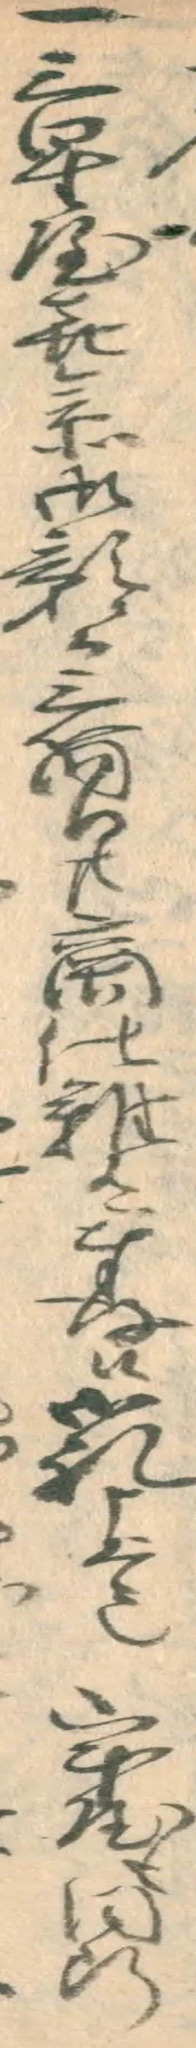一三星屋喜兵衛御影ニ而三箇日共商仕難有奉存候御礼申上也山本屋も同断
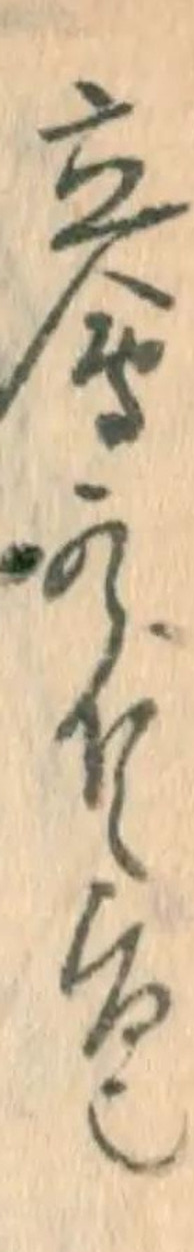立会可被下候旨也
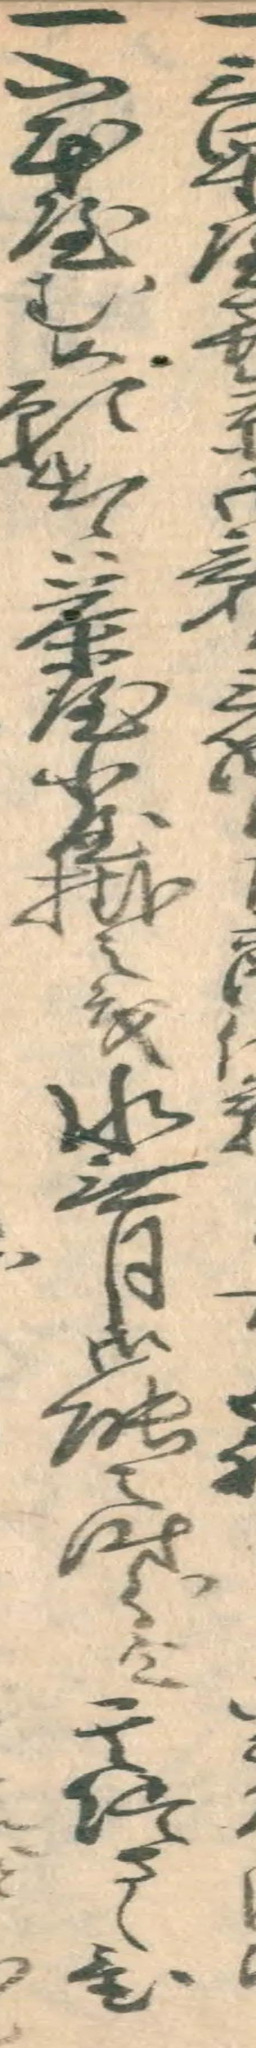一山本屋むめ願出候ハ茶屋小屋掛之義水無月御能之時分迄其儘さし置
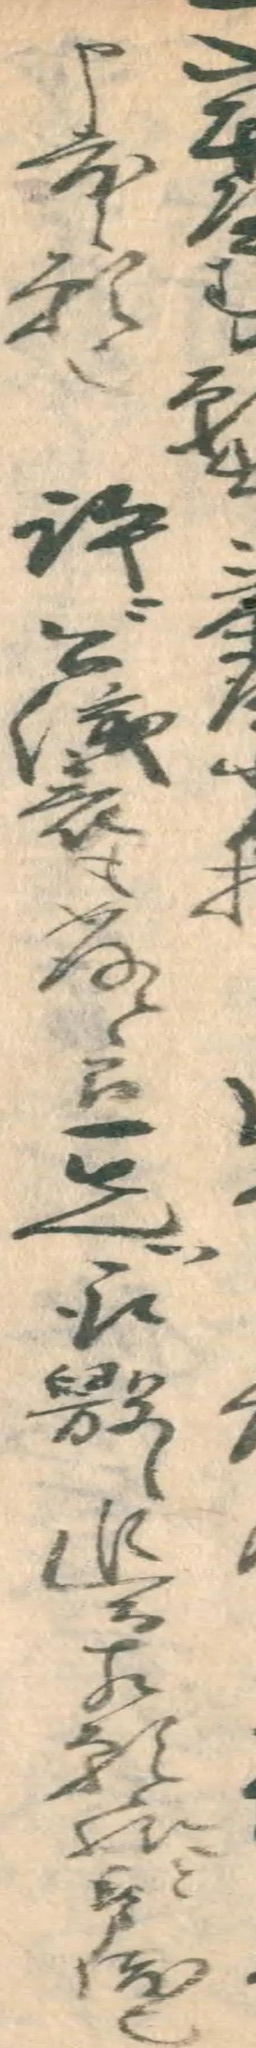申度候願也評ニ公儀表も如何候間一先ツ取毀し追而相願候様ニと被申渡也
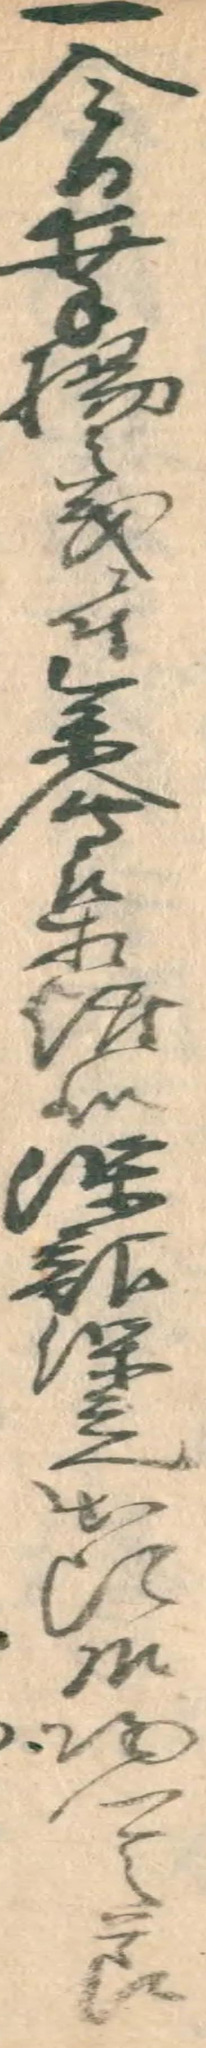一今日井手揚之義ニ付参会被相催候処保韶保覚出頭故帰郷之節
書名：賀茂社記録. 第58冊
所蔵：国立国会図書館 National Diet Library, JAPAN
